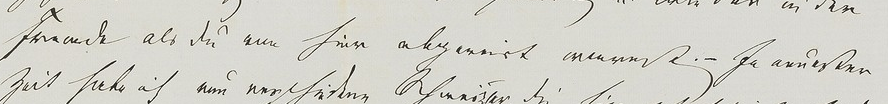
Fremde als du von hier abgereist warest. – In neuester
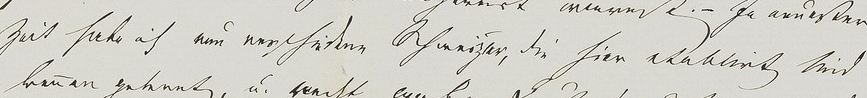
Zeit habe ich nun verschiedene Schweizer, die hier etablirt sind
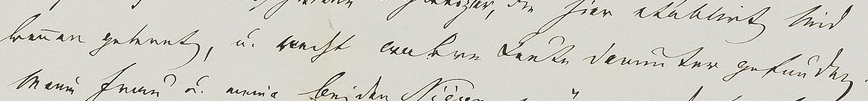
kennen gelernt, u. recht wakre Leute darunter gefunden.
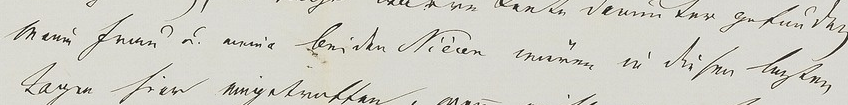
Meine Frau u. meine beiden Niècen wären in diesen lezten
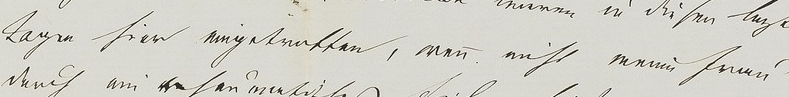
Tagen hier eingetroffen, wenn nicht meine Frau
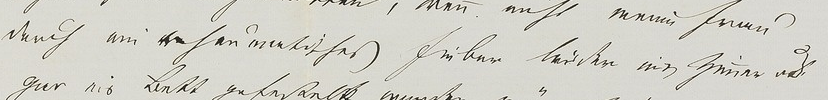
durch ein rheumatisches Fieber leider ins Zimmer od.
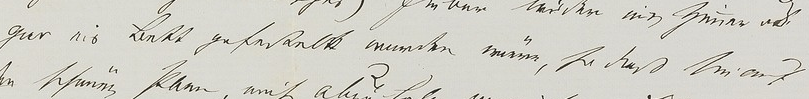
gar ins Bett gefeßelt worden wäre, so daß sie auf
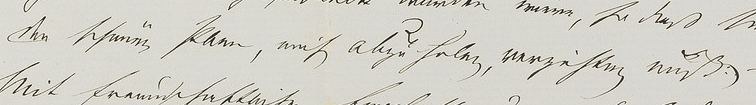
den schönen Plan, mich abzuholen, verzichten muß. – –
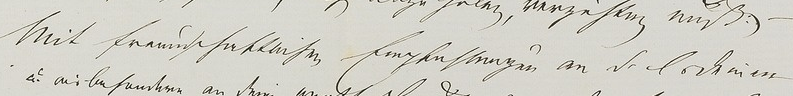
Mit freundschaftlichen Empfehlungen an d. l. Deinen
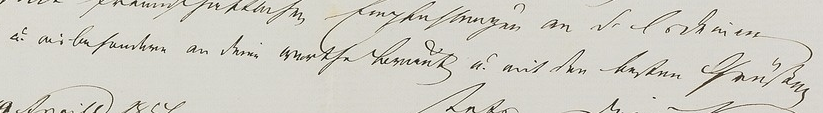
u. insbesondere an deine werthe Braut u. mit den besten Grüßen
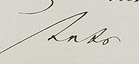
stets
